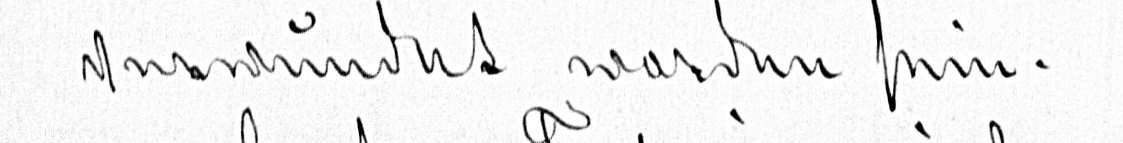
verwundet worden sein.
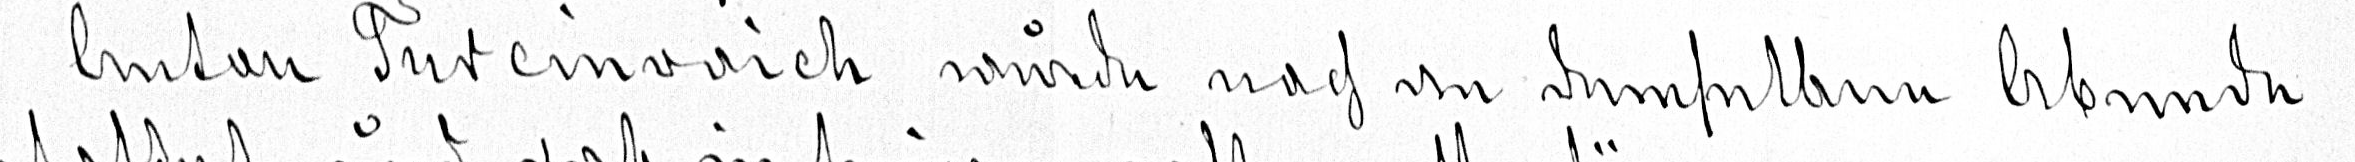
Anton Turcinovich wurde noch an demselben Abende
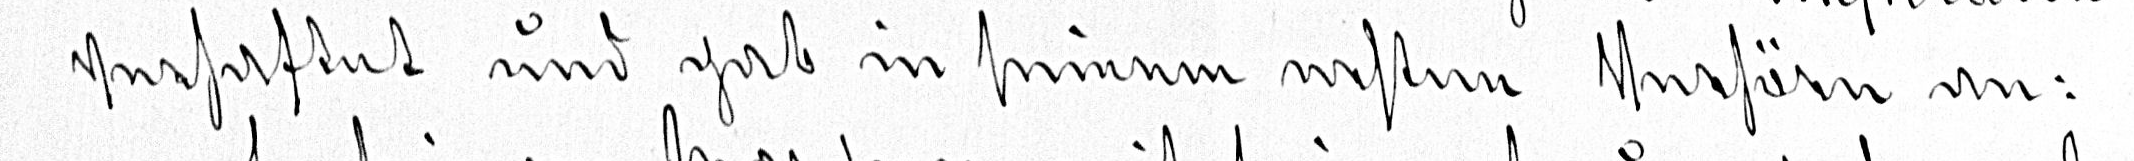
verhaftet und gab in seinem ersten Verhöre an:
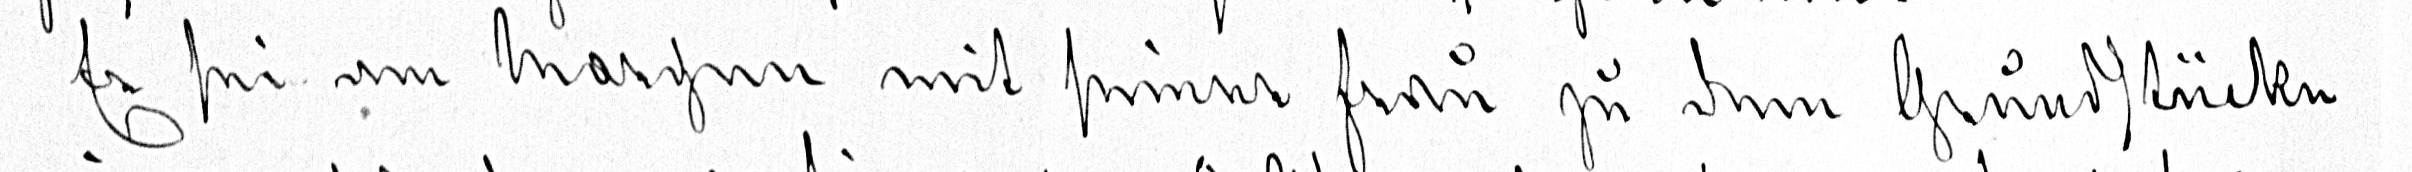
Er sei am Morgen mit seiner Frau zu dem Grundstücke
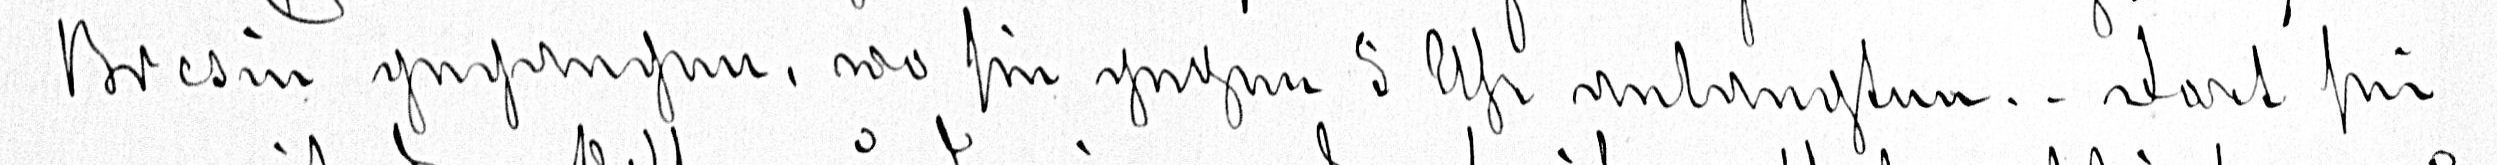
Brcsin gegangen, wo sie gegen 5 Uhr anlangten.- Dort sei
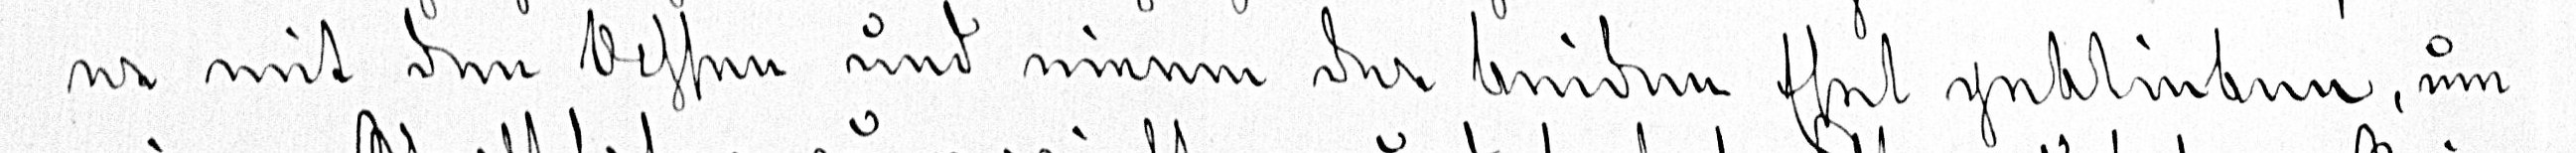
er mit den Ochsen und einem der beiden Esel geblieben, um
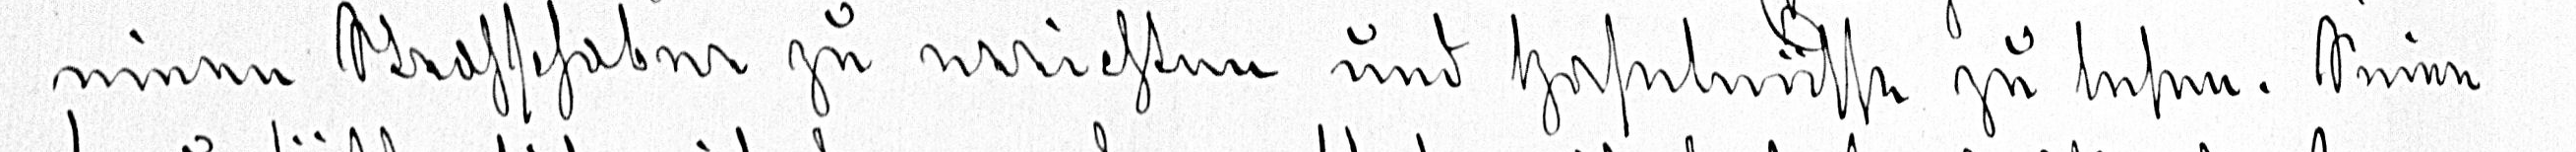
einen Strohschober zu errichten und Haselnüsse zu lesen. Seien
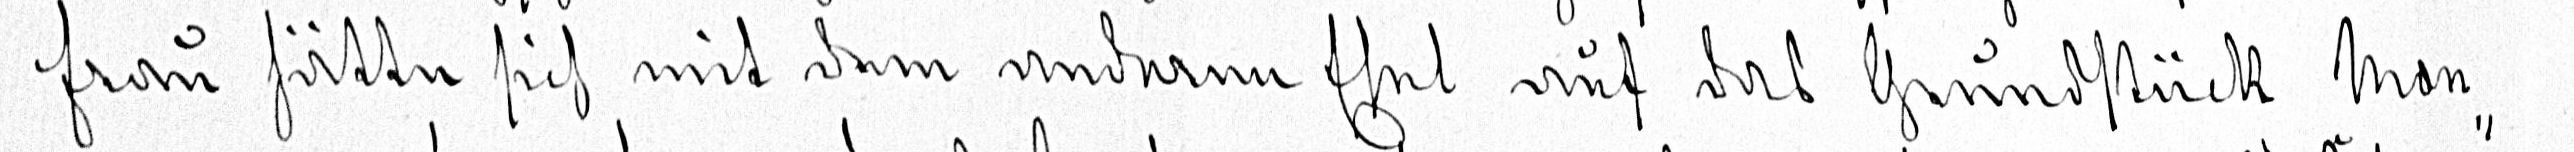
Frau hätte sich mit dem anderen Esel auf das Grundstück Mon¬
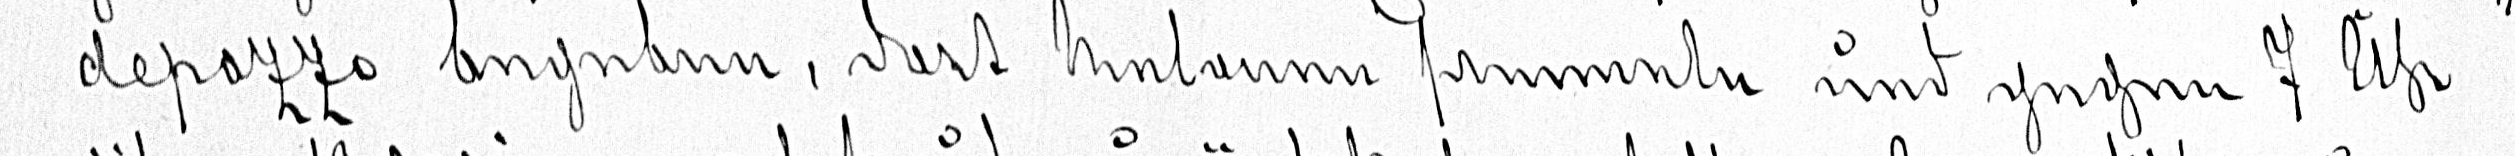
depozzo begeben, dort Melonen sammeln und gegen 7 Uhr
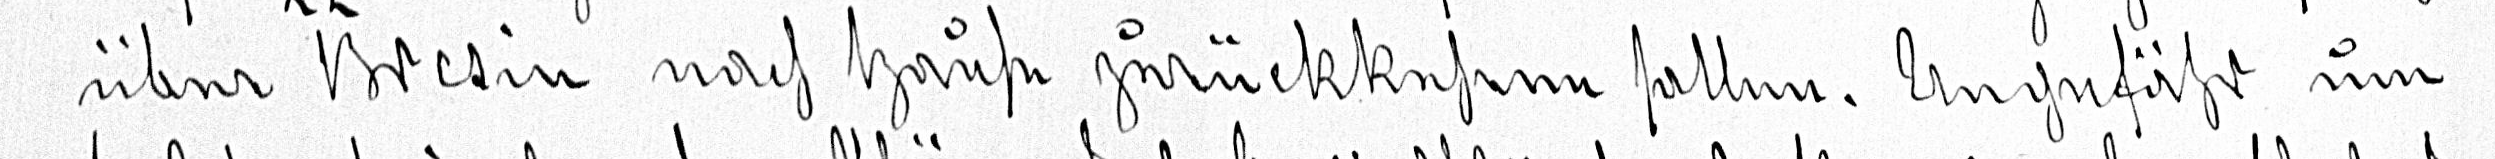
über Brcsin nach Hause zurückkehren sollen. Ungefähr um
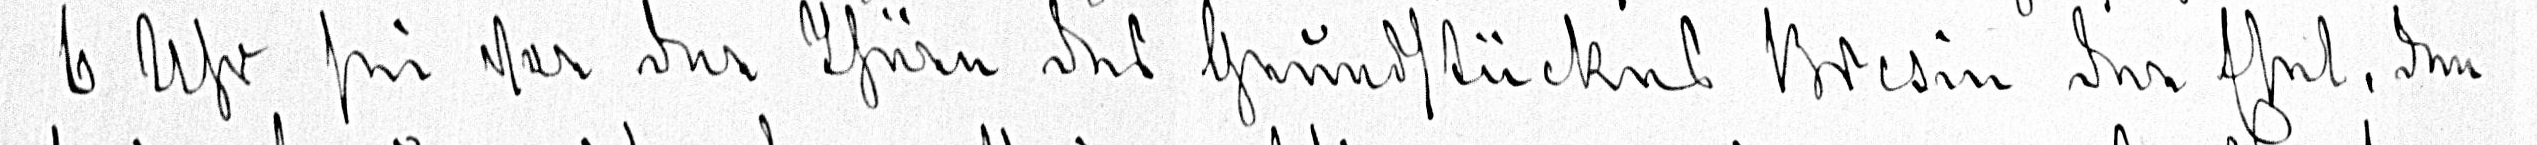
6 Uhr sei vor der Thürn des Grundstückes Brcsin der Esel, den
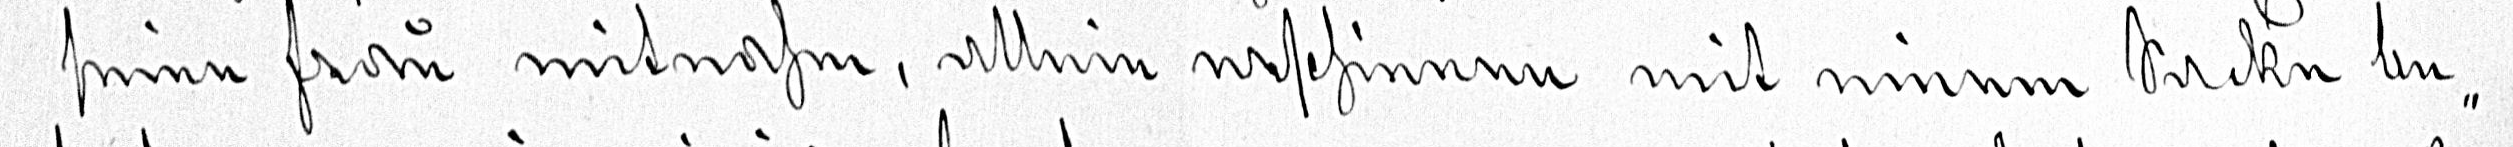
seine Frau mitnahm, allein erschienenmit einem Sacke be¬
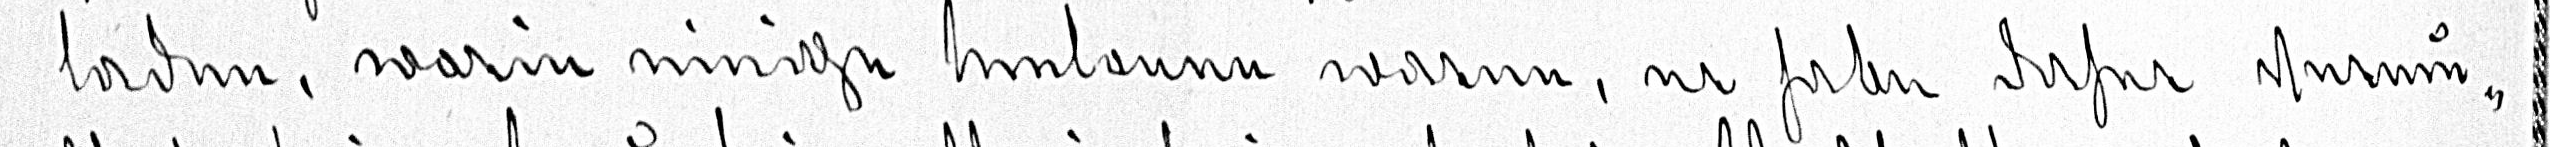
laden, worin einige Melonen waren, er habe daher vermu¬
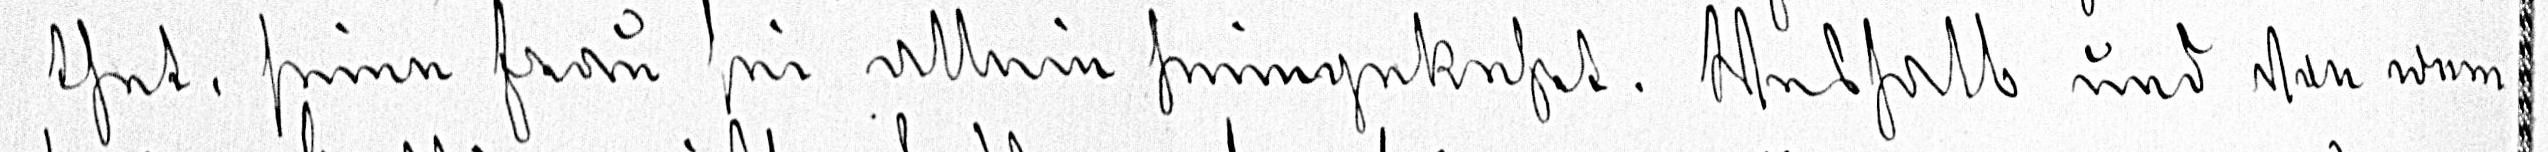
thet, seine Frau sei allein heimgekehrt. Weshalb und von wem
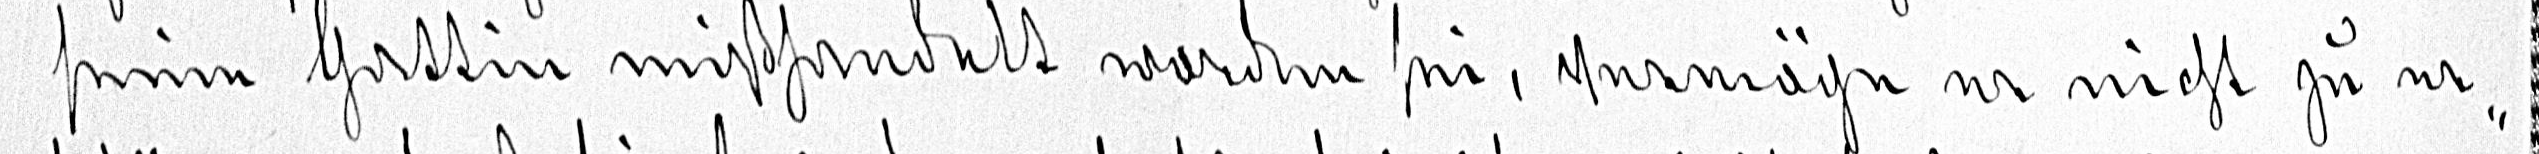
seine Gattin mißhandelt worden sei, vermöge er nicht zu er¬
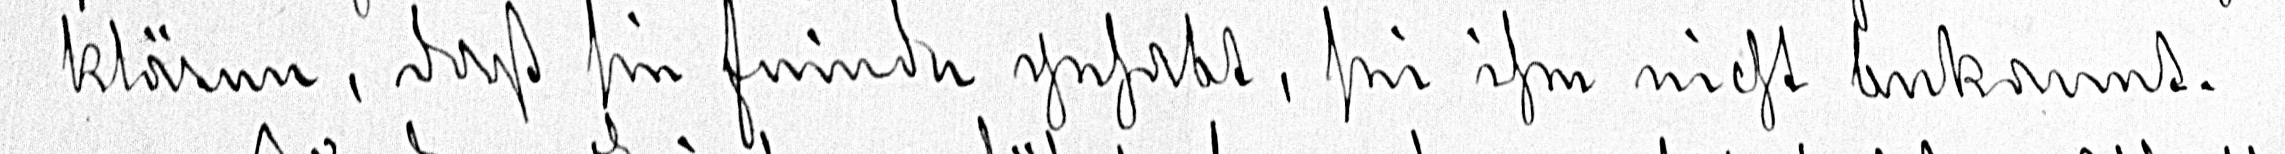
klären, daß sie Feinde gehabt, sei ihm nicht bekannt.
